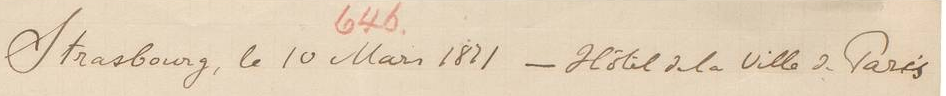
Strasbourg, le 10 Mars 1871 – Hôtel de la Ville de Paris
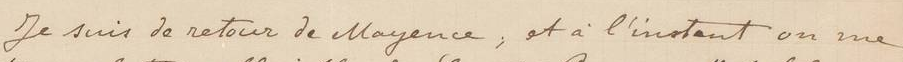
Je suis de retour de Mayence; et à l'instant on me
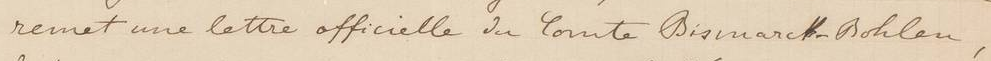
remet une lettre officielle du Comte Bismarck-Bohlen,
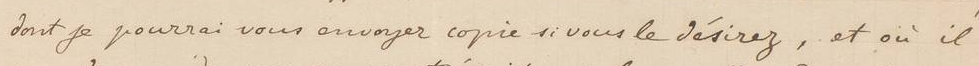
dont je pourrai vous envoyer copie si vous le désirez, et où il
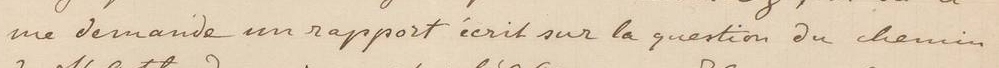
me demande un rapport écrit sur la question du chemin
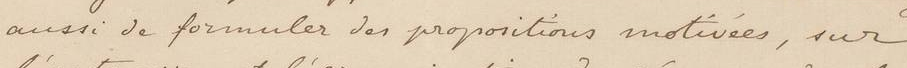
aussi de formuler des propositions motivées, sur
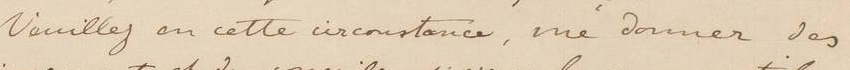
Veuillez en cette circonstance, me donner des
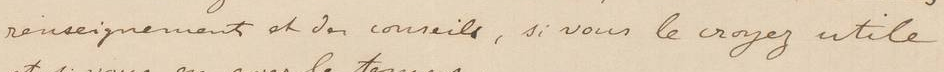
renseignements et des conseils, si vous le croyez utile
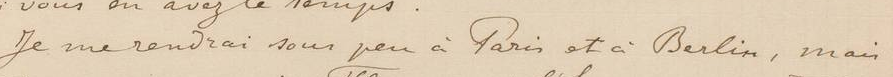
Je me rendrai sous peu à Paris et à Berlin, mais
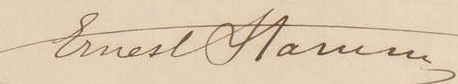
Ernest Stamm
